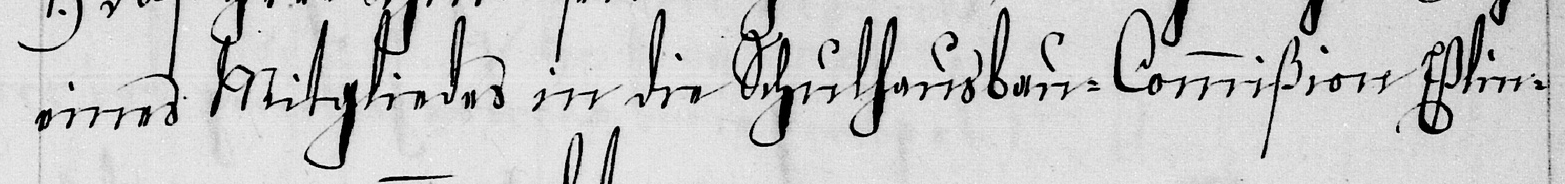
eines Mitgliedes in die Schulhausbau-Commißion Eßlin¬
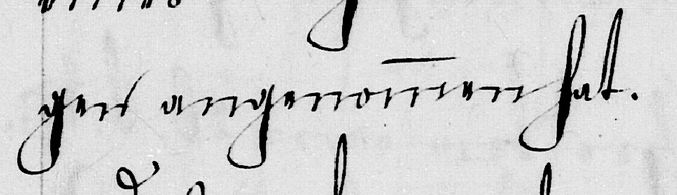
gen angenommen hat.
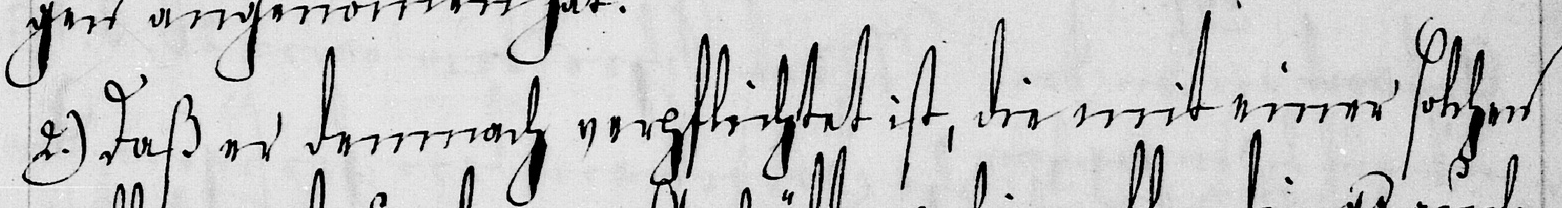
2.) Daß er demnach verpflichtet ist, die mit einer solchen
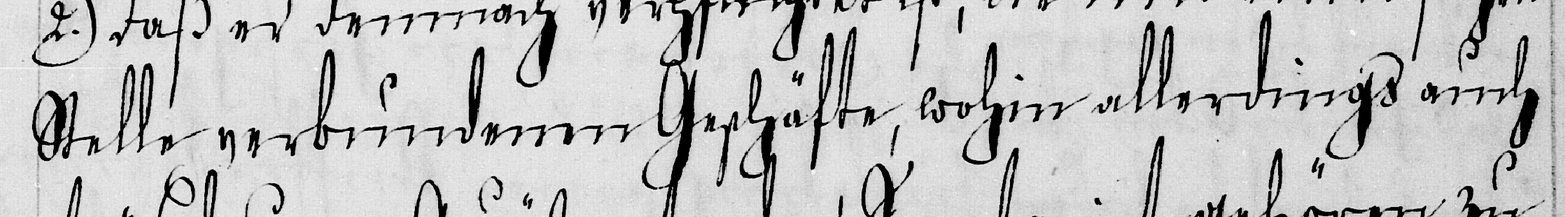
Stelle verbundenen Geschäfte, wohin allerdings auch
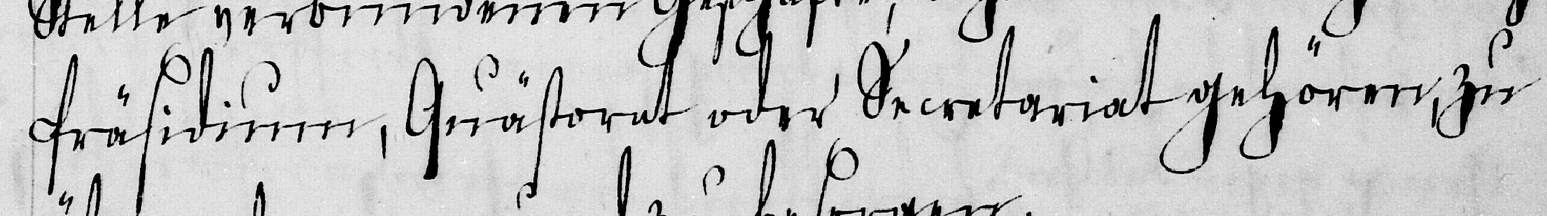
Präsidium, Quästorat oder Secretariat gehören, zu
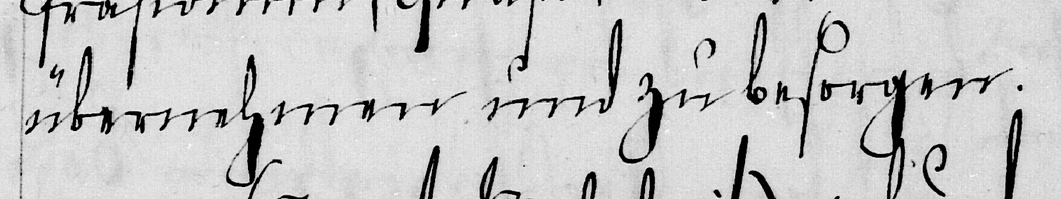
übernehmen und zu besorgen.
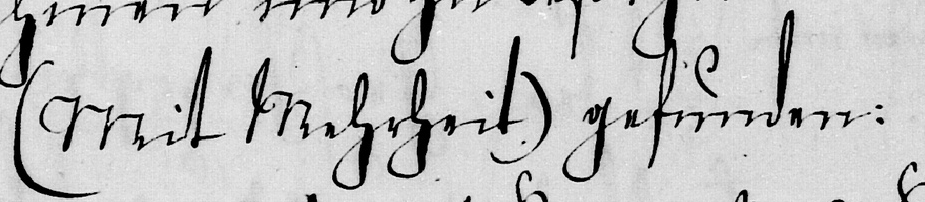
(Mit Mehrheit) gefunden:
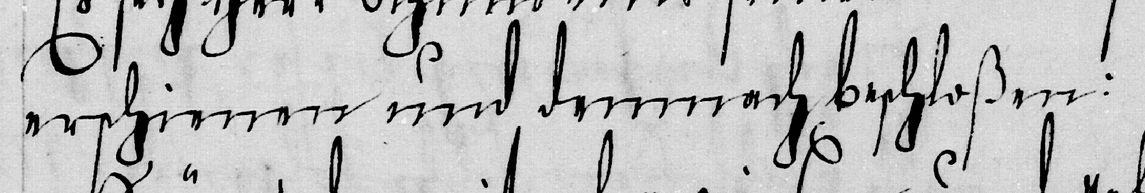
erschienen und demnach beschloßen:
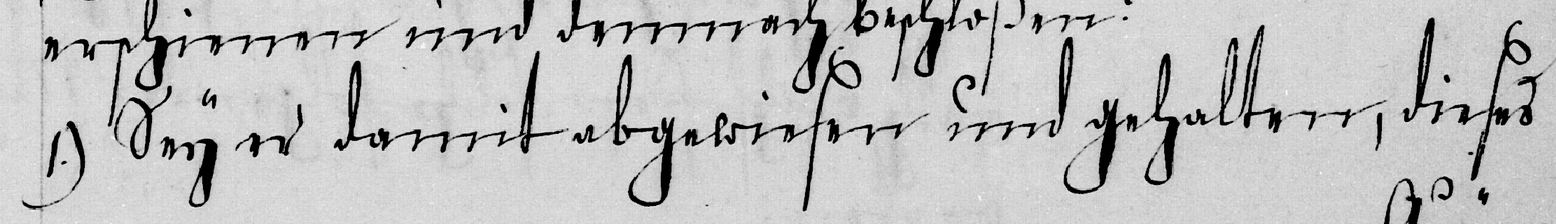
1.) Sey er damit abgewiesen und gehalten, dieses
